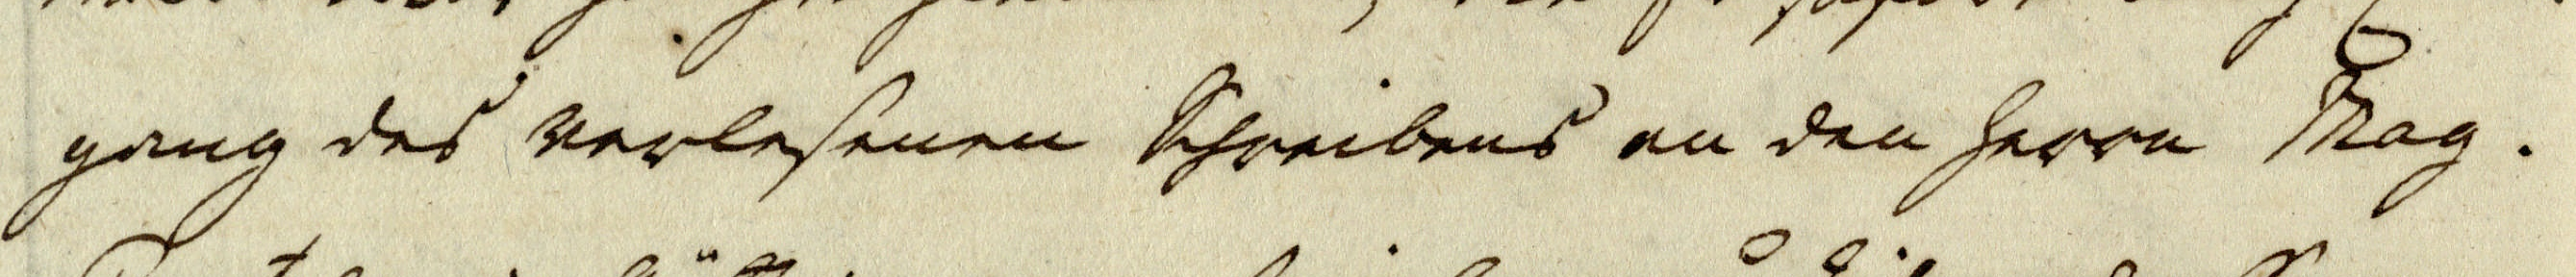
gang des verlesenen Schreibens an den Herrn Mag.
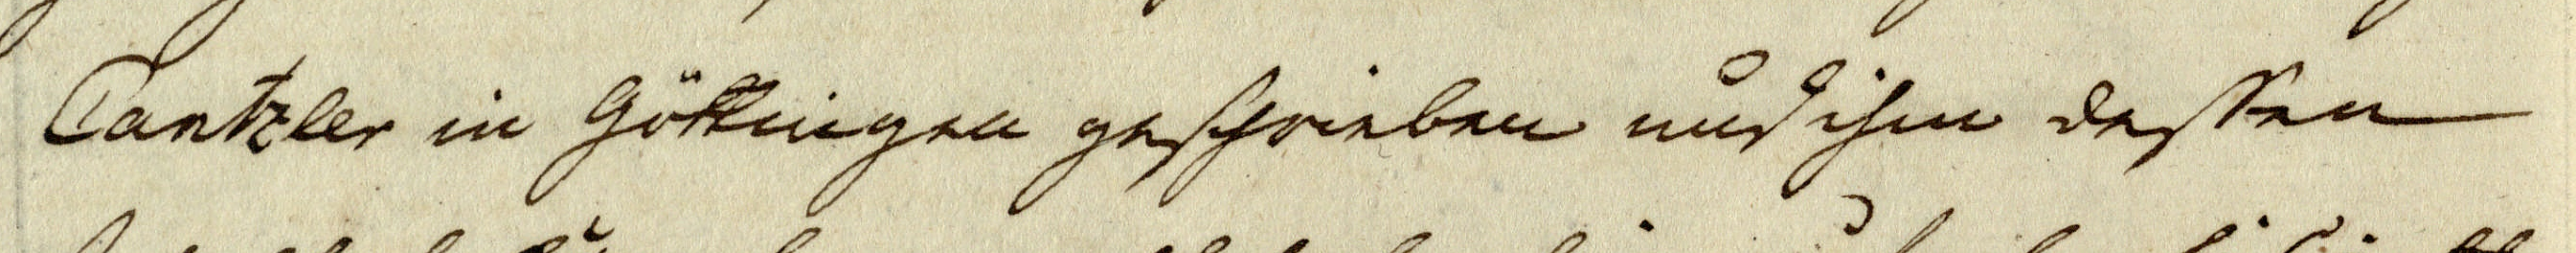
Cantzler in Göttingen geschrieben und ihm dessen
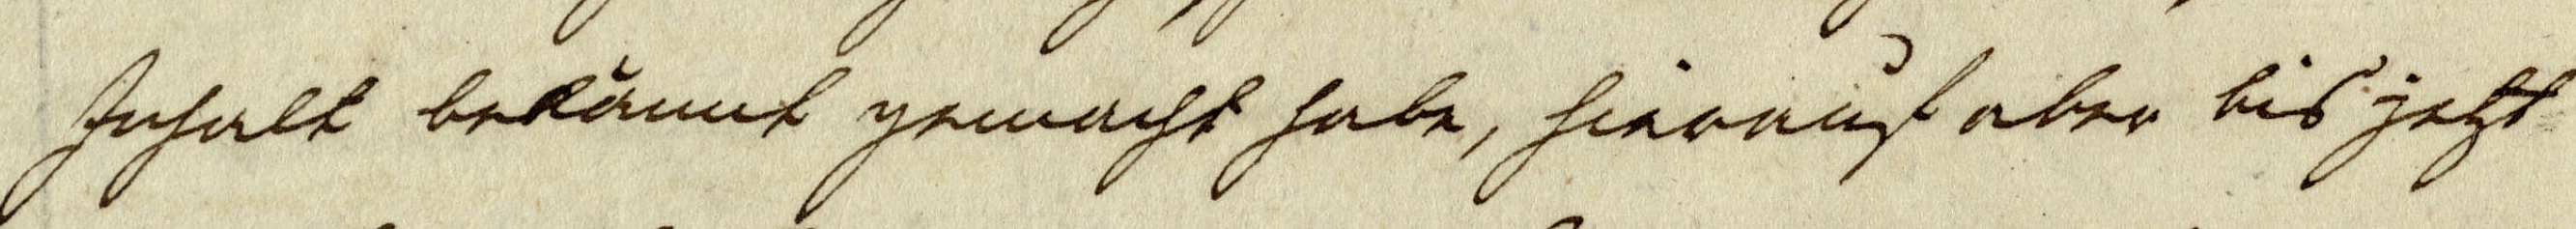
Inhalt bekannt gemacht habe, hierauf aber bis jetzt
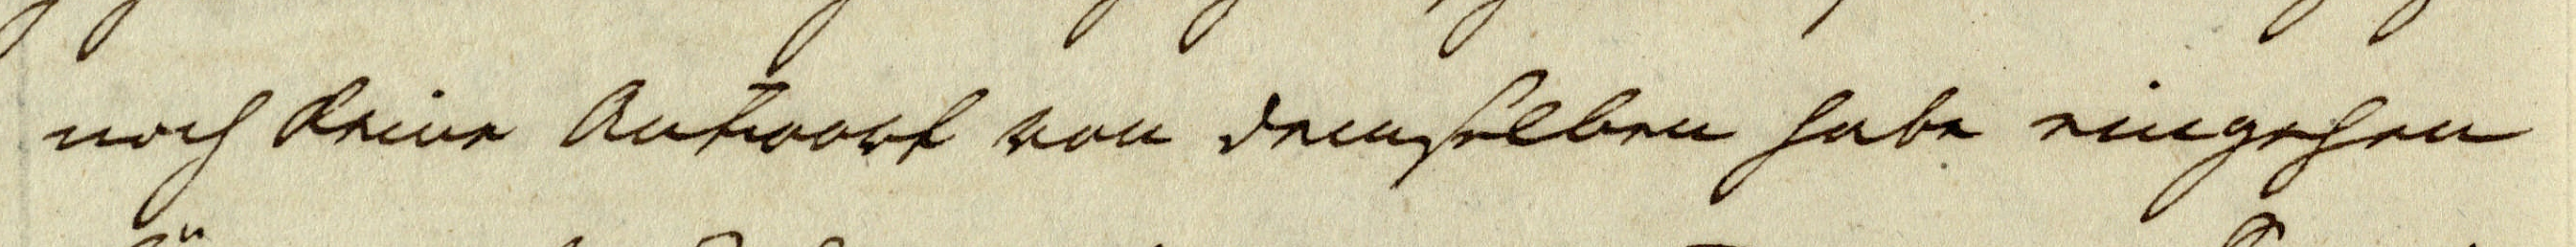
noch keine Antwort von demselben habe eingehen
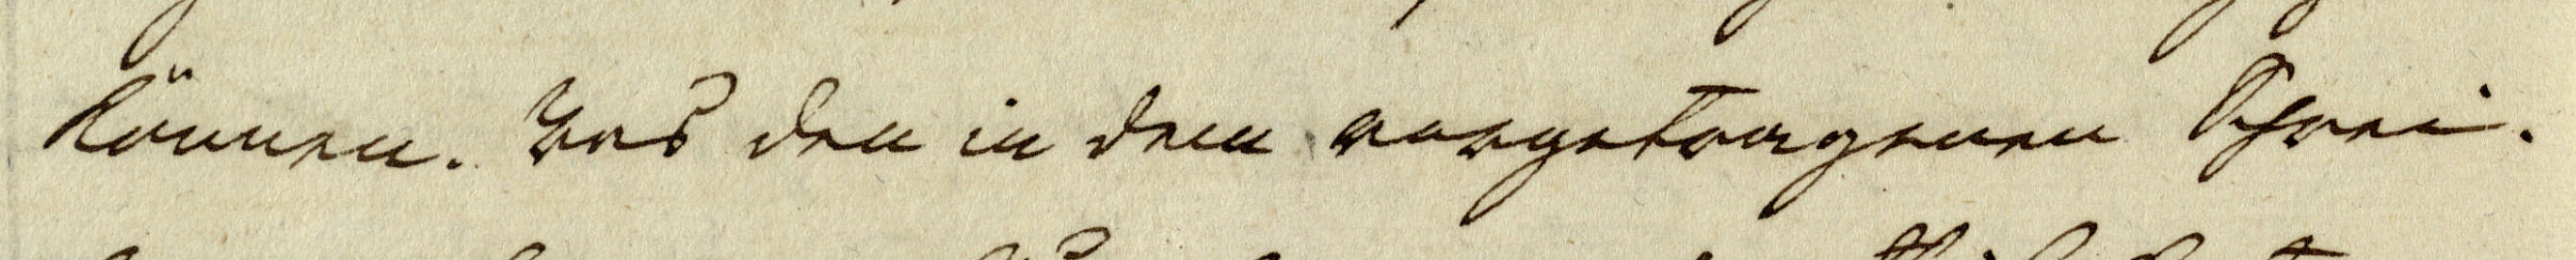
können. Was den in dem vorgetragenen Schrei¬
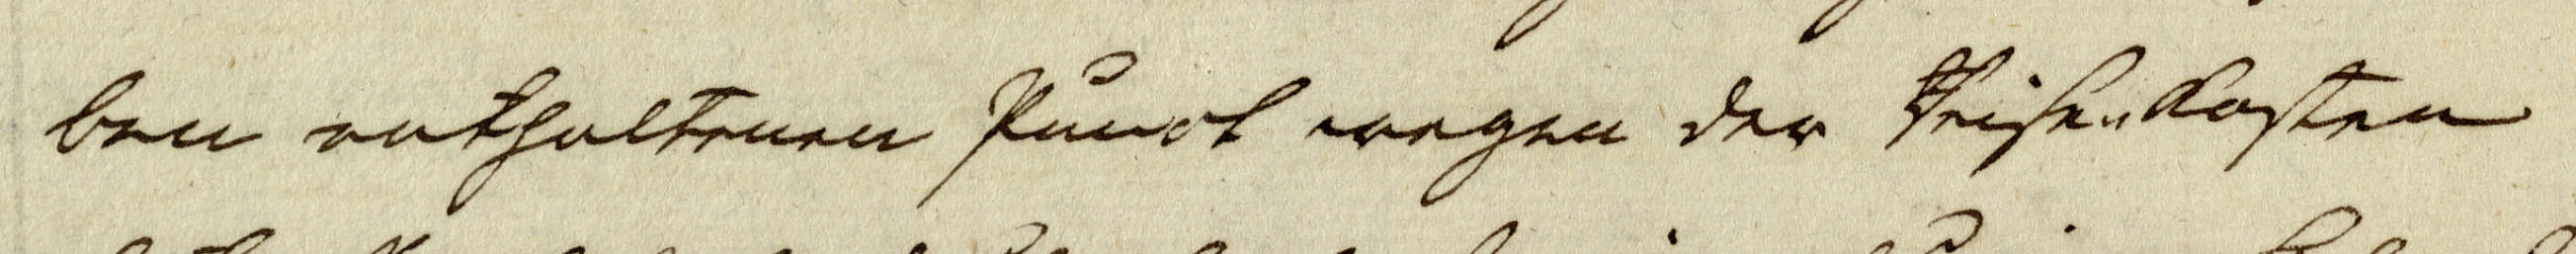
ben enthaltenen Punct wegen der Reisekosten
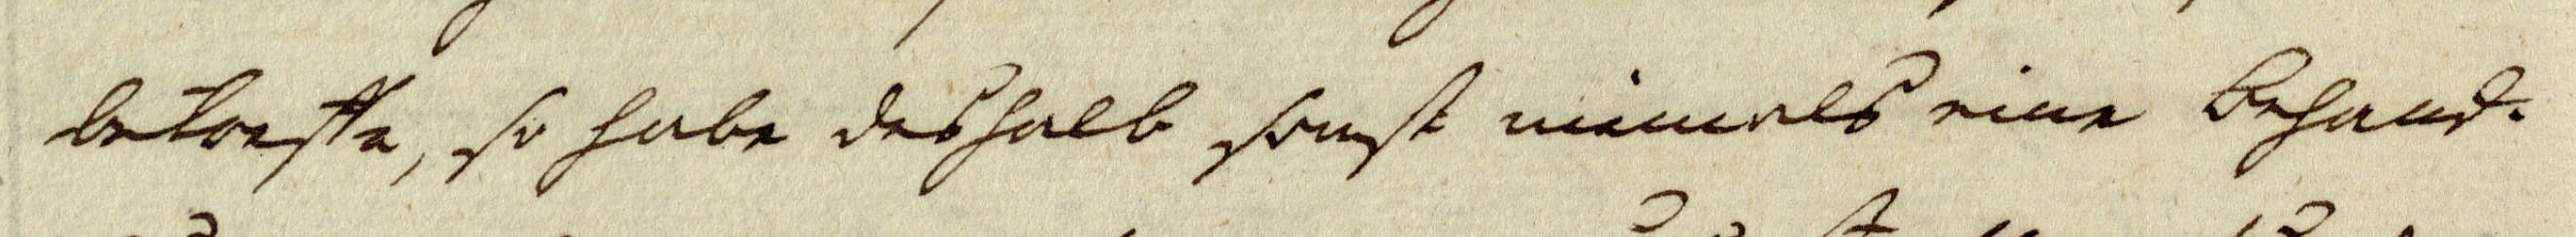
betreffe, so habe deshalb sonst niemals eine Behand¬
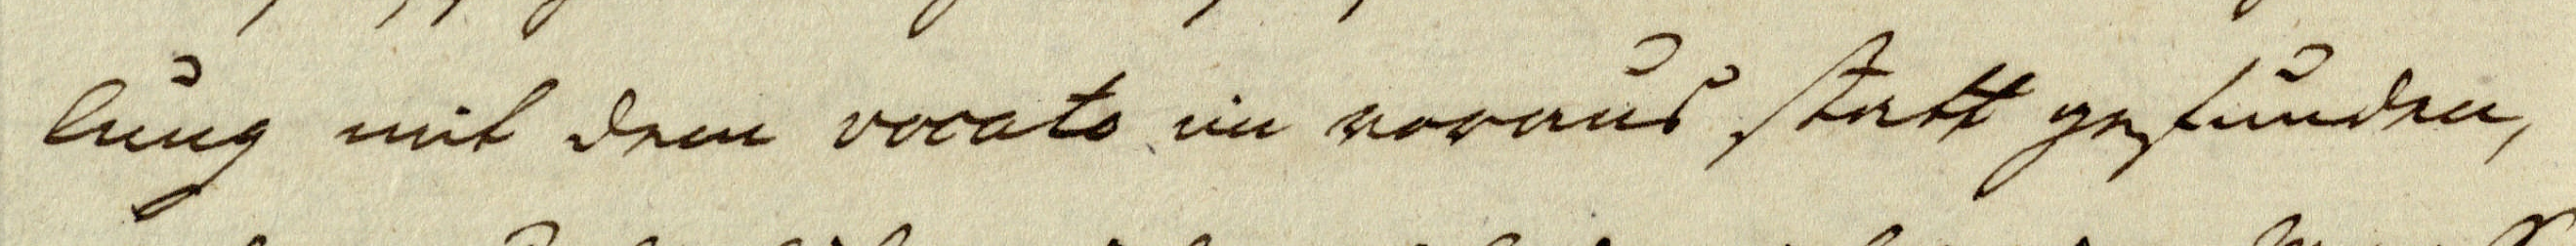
lung mit dem vocato im voraus statt gefunden,
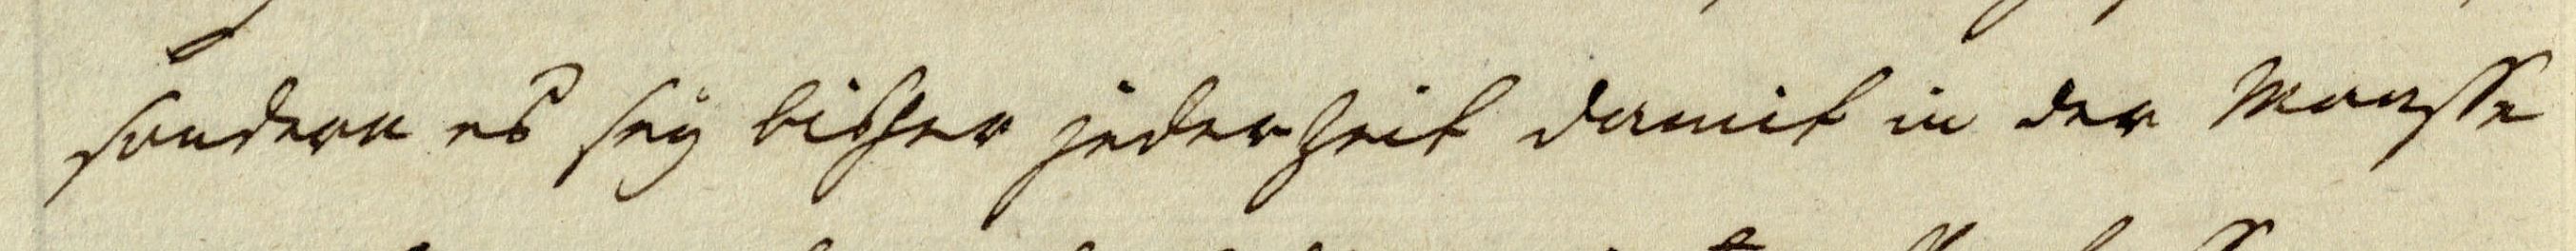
sondern es seÿ bisher jederzeit damit in der Maasse
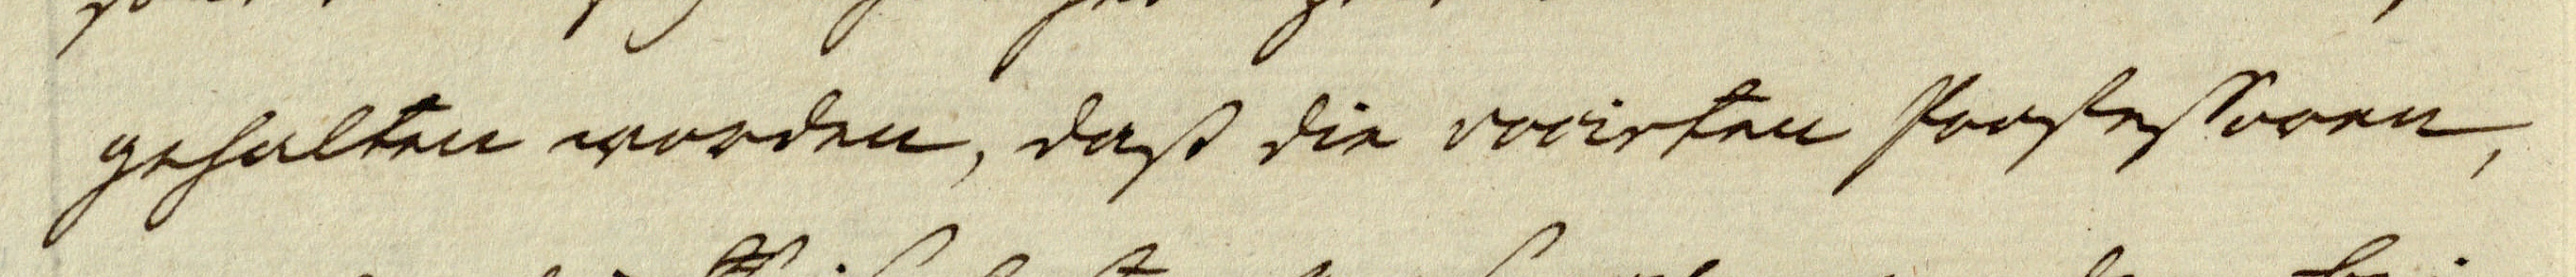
gehalten worden, daß die vocirten Professoren,
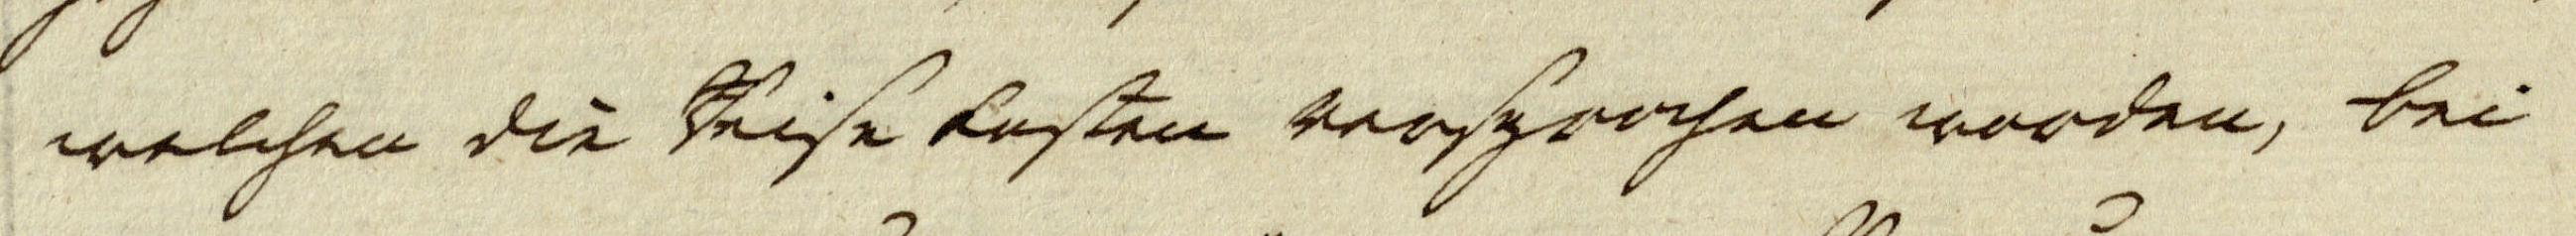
welchen die Reisekosten versprochen worden, bei
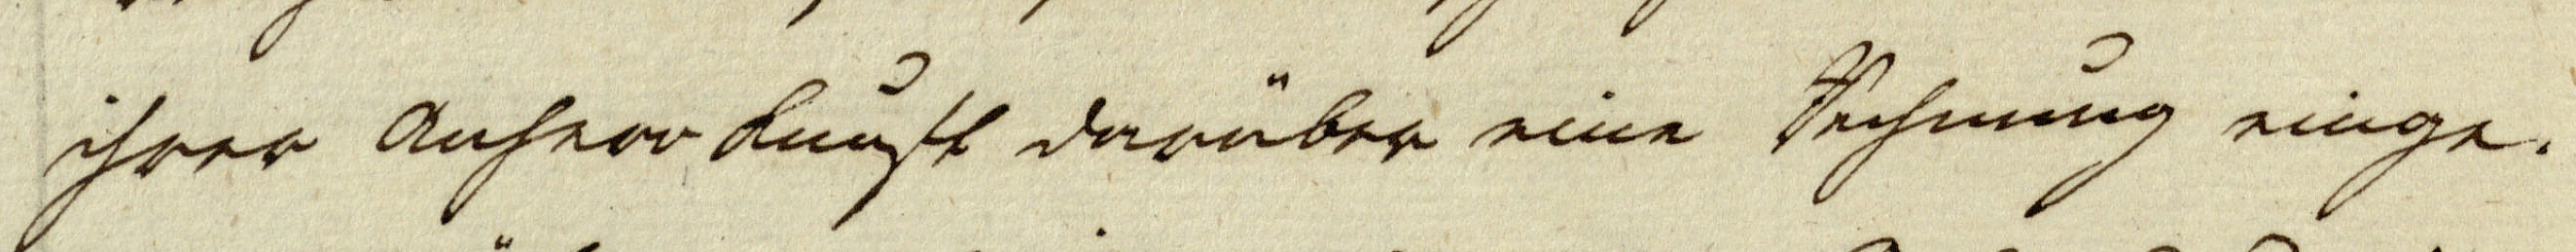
ihrer Anhero kunft darüber eine Rechnung einge¬
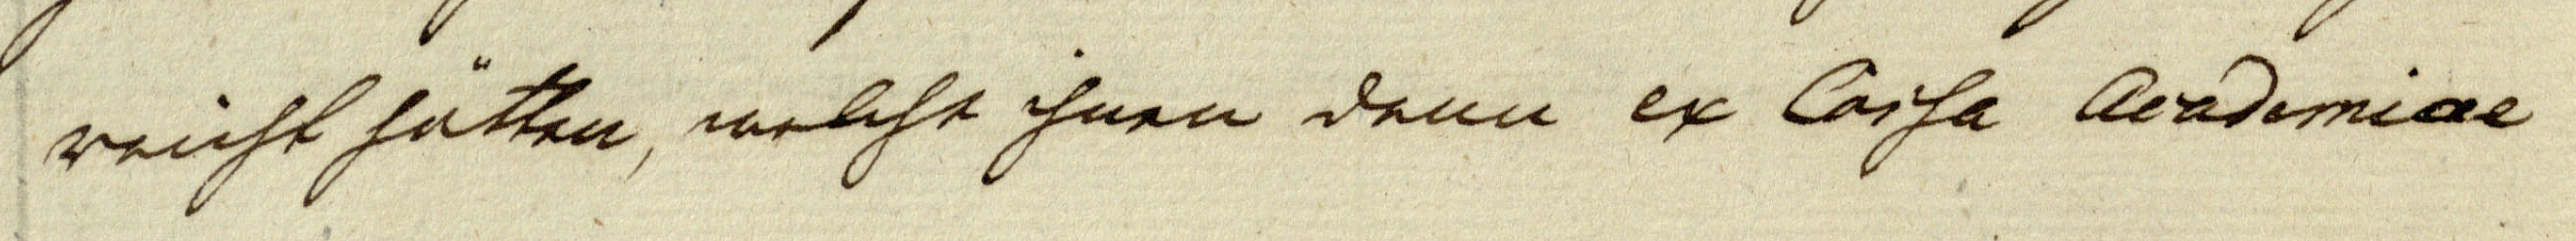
reicht hätten, welche ihnen denn ex Cassa Academiae
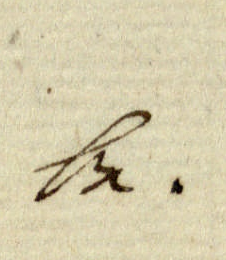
be
